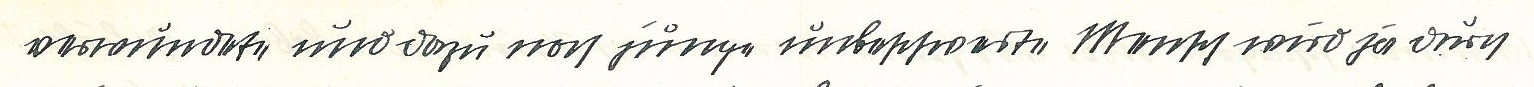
verwundete und dazu noch junge unbeschwerte Mensch wird ja durch
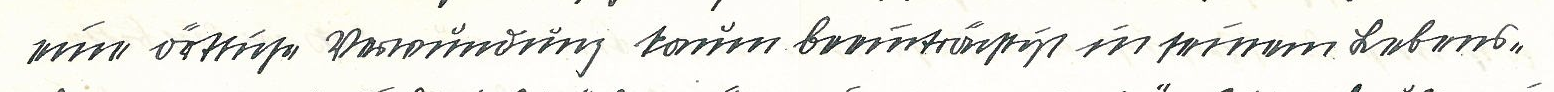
eine örtliche Verwundung kaum beeinträchtigt in seinem Lebens¬
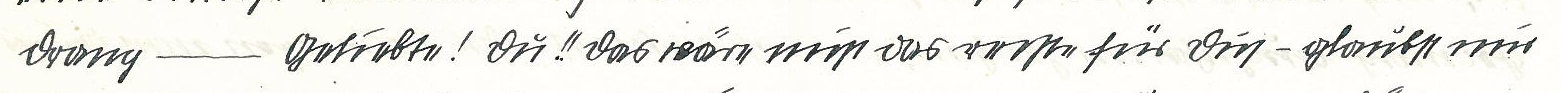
drang – – – Geliebte! Du!! Das wäre nicht das rechte für Dich – glaubst mir
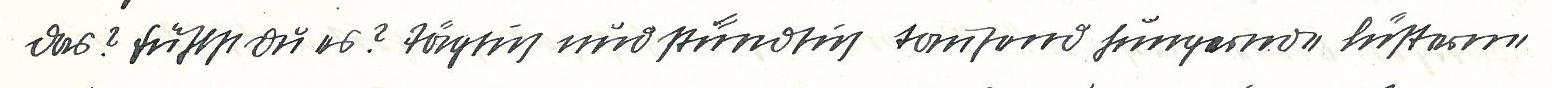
das? Fühlst Du es? Täglich und stündlich tausend hungernde lüsterne
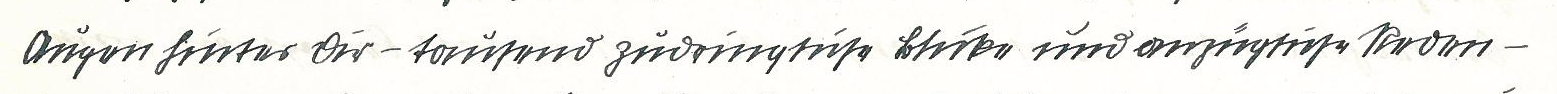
Augen hinter Dir – tausend zudringliche Blicke und anzügliche Reden –
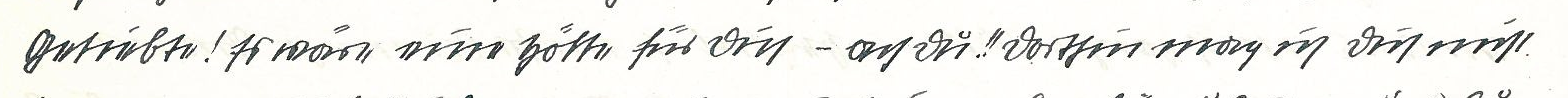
Geliebte! Es wäre eine Hölle für Dich – ach Du!! Dorthin mag ich Dich nicht
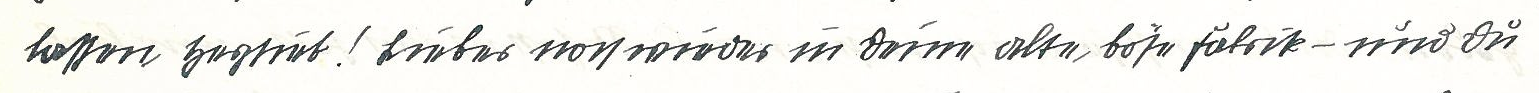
lassen, Herzlieb! Lieber noch wieder in Deine alte, böse Fabrik – und Du
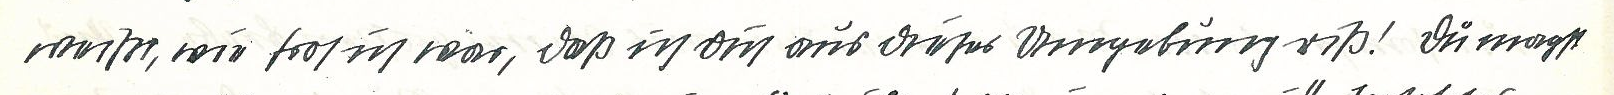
weißt, wie froh ich war, daß ich Dich aus dieser Umgebung riß! Du magst
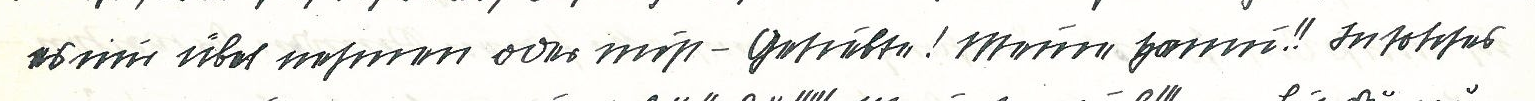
es mir übel nehmen oder nicht – Geliebte! Meine!! In solches
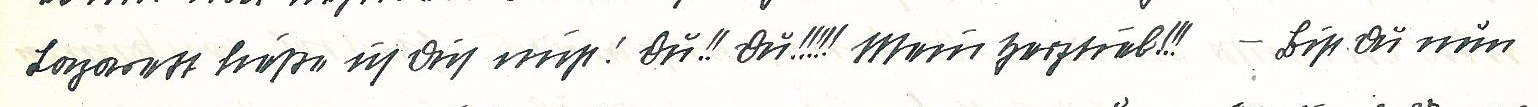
Lazarett ließe ich Dich nicht! Du!! Du!!!!! Mein Herzlieb!!! – Bist Du nun
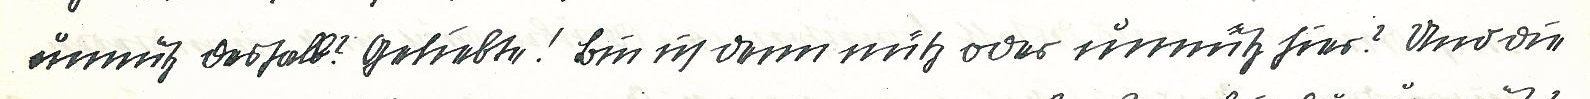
unnütz deshalb? Geliebte! Bin ich denn nütz oder unnütz hier? Und die
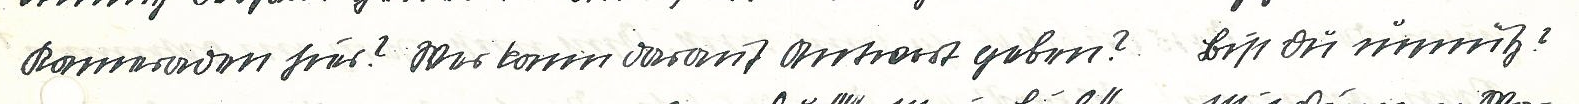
Kameraden hier? Wer kann darauf Antwort geben? Bist Du unnütz?
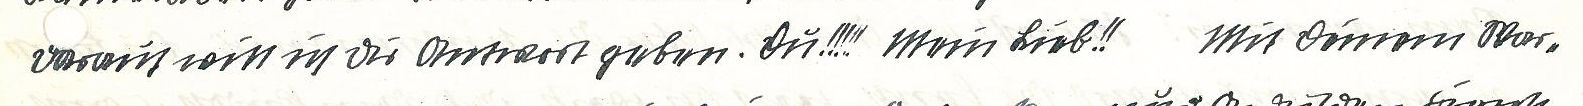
Darauf will ich Dir Antwort geben. Du!!!!! Mein Lieb!! Mit Deinem War¬
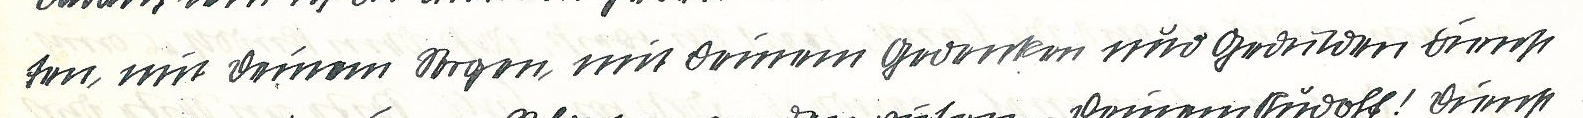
ten, mit Deinem Sorgen, mit Deinem Gedenken und Gedulden dienst
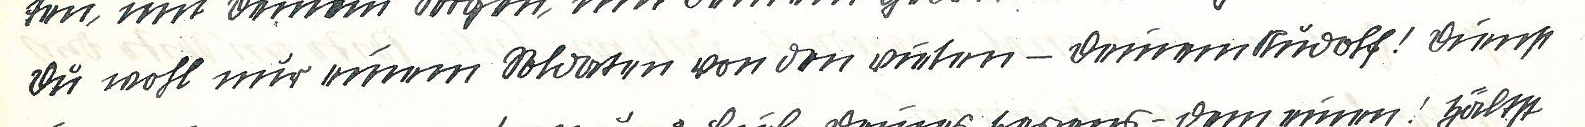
Du wohl nur einem Soldaten von den vielen – Deinem Rudolf! Dienst
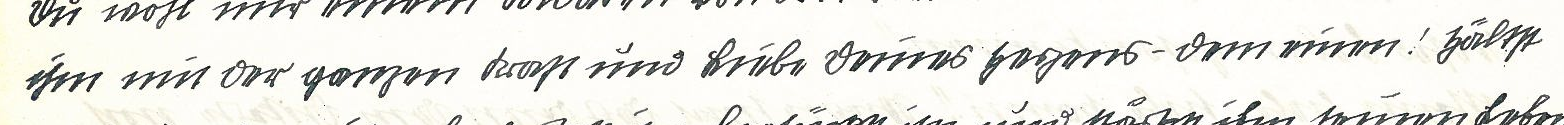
ihm mit der ganzen Kraft und Liebe Deines Herzens – dem einen! Hältst
